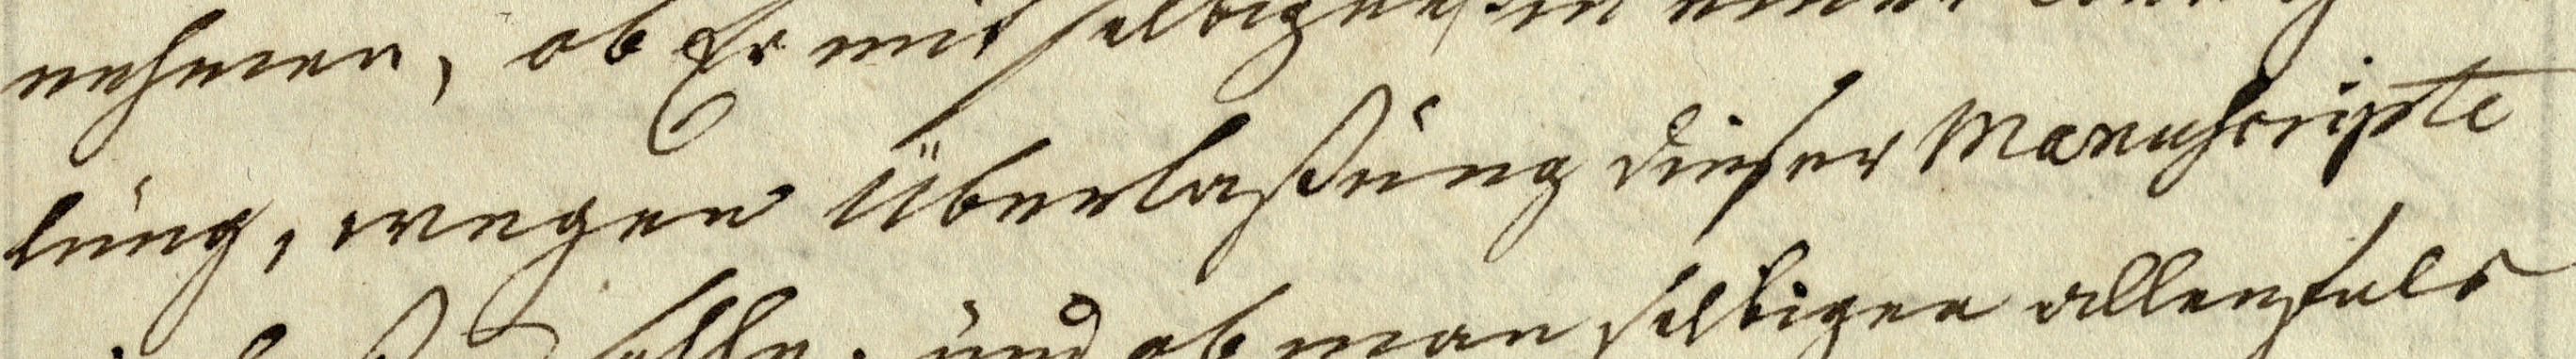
lung, wegen Überlaßung dieser Manuscripte
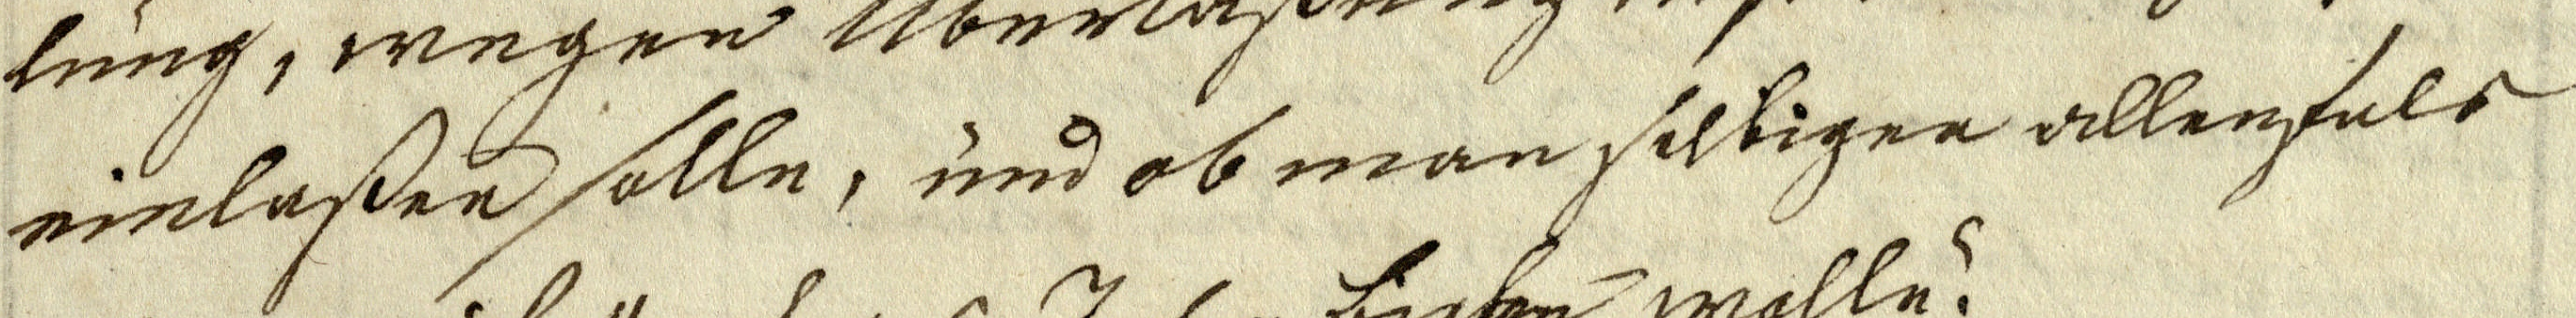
einlaßen solle, und ob man selbigen allenfals
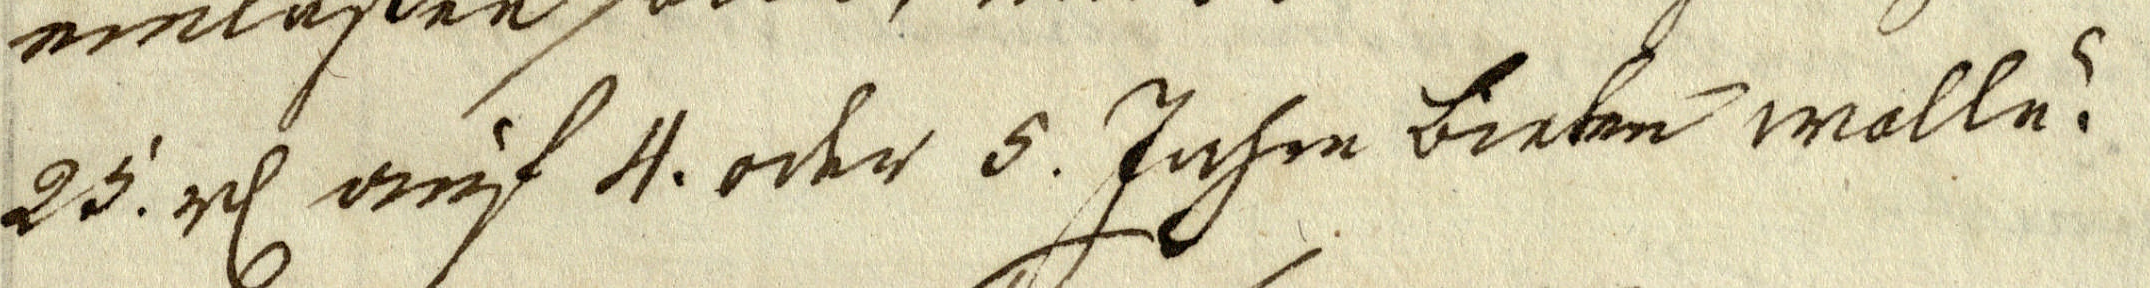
25. r. auf 4. oder 5. Jahre bieten wolle.
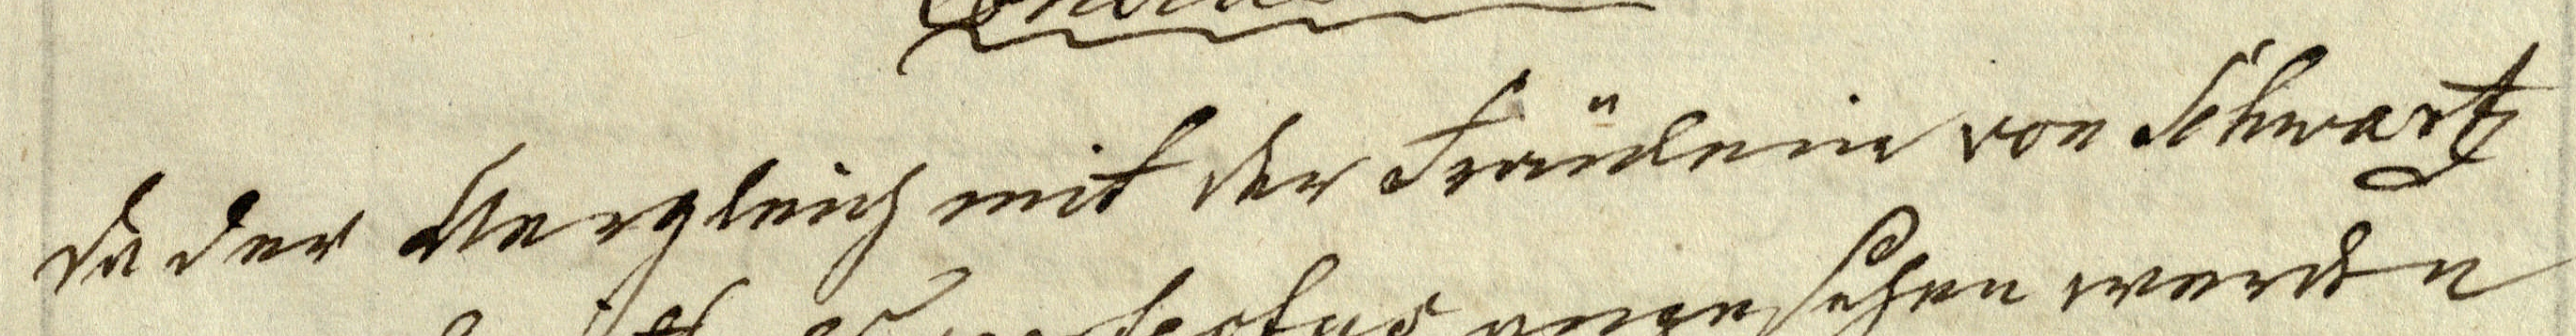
Da der Vergleich mit der Fräulein von Schwartz
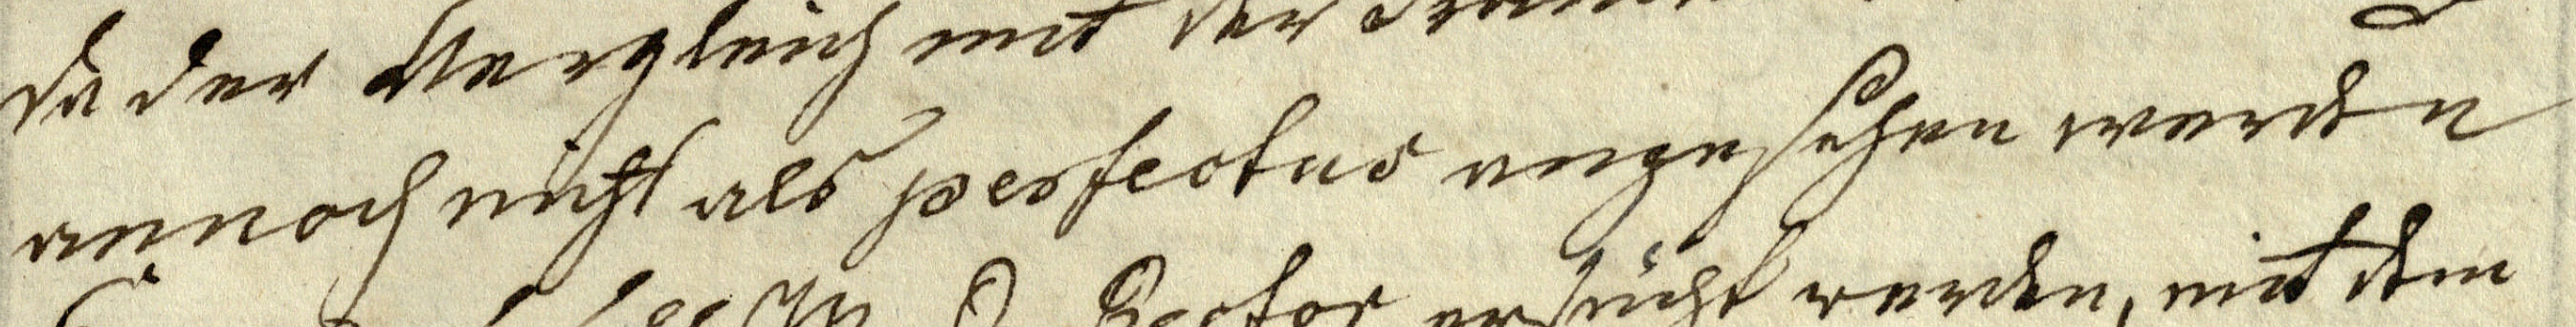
annoch nicht als perfectus angesehen werden
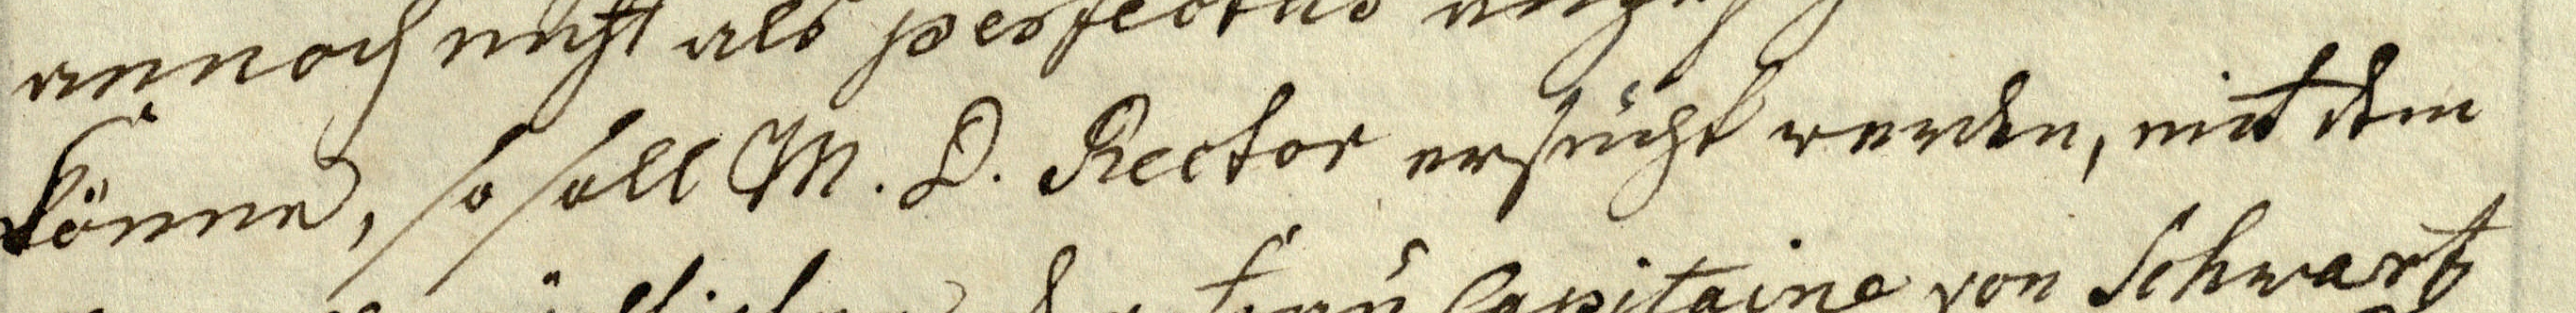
könne, so soll M. D. Rector ersucht werden, mit dem
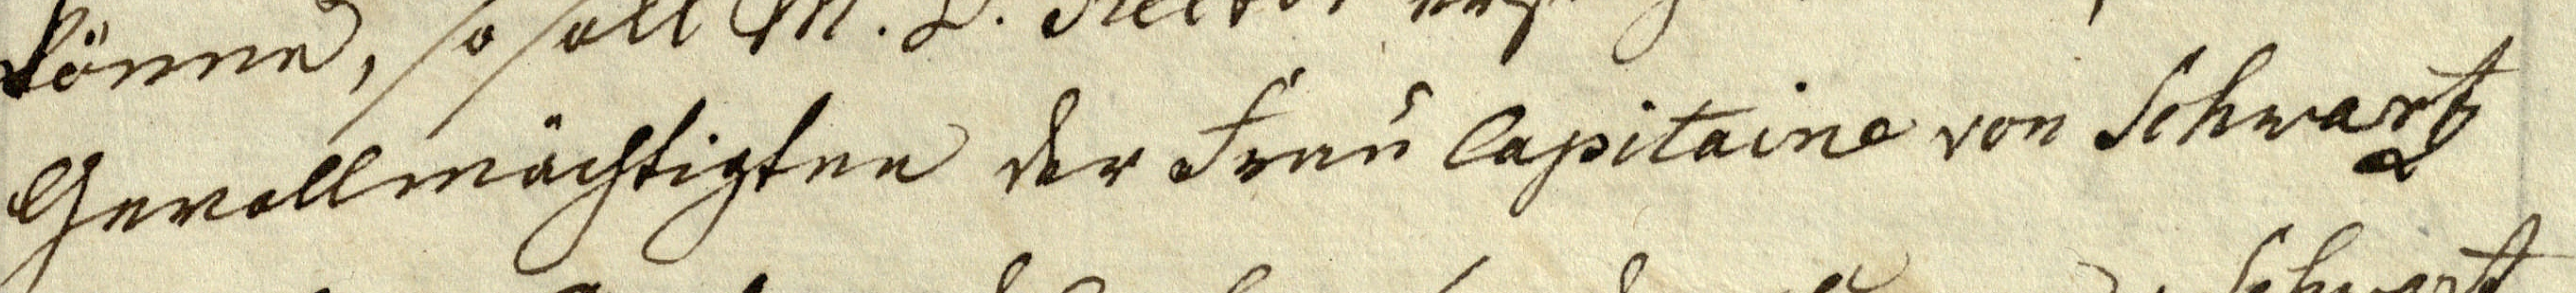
Gevollmächtigten der Frau Capitaine von Schwartz
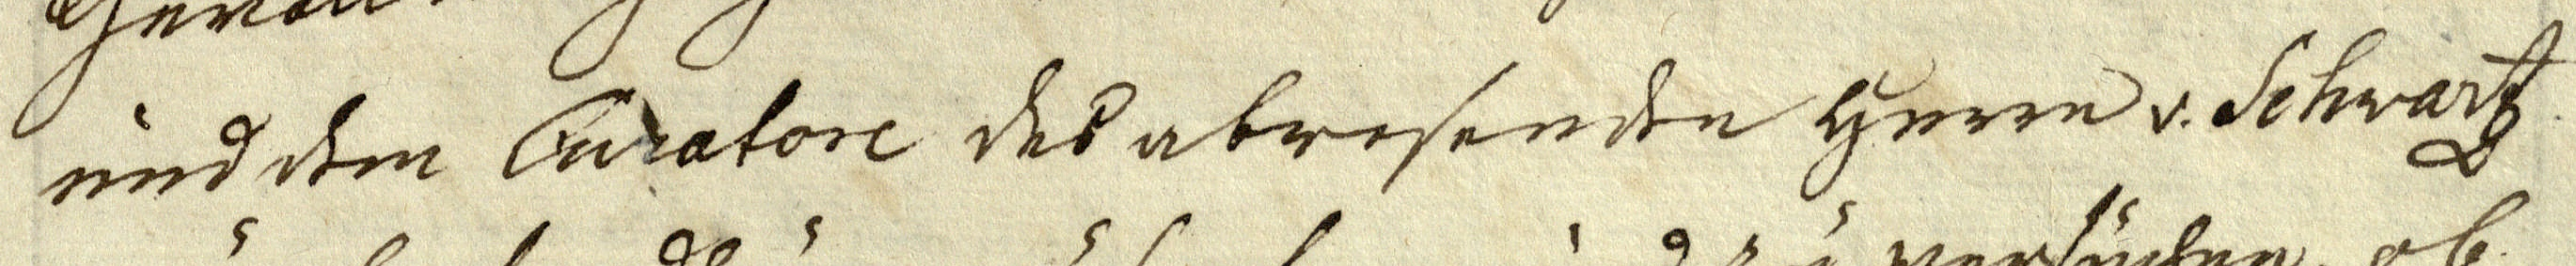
und dem Curatore des abwesenden Herrn v. Schwartz
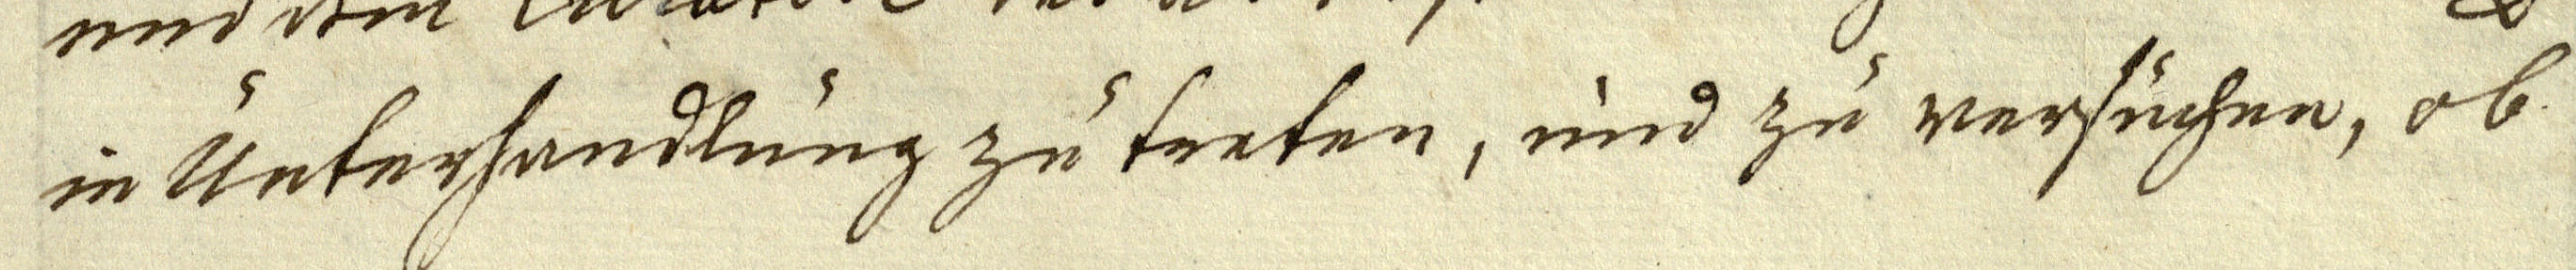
in Unterhandlung zu treten, und zu versuchen, ob
